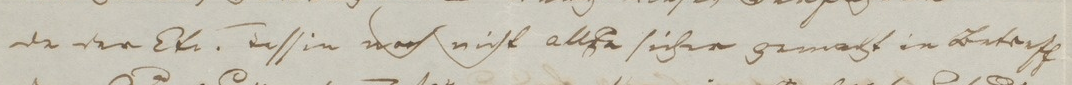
de der Ctn. Tessin noch nicht allzu sicher gemacht in Betreff
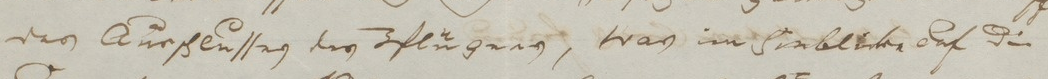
des Ausschlusses des Splügens, was im Hinblicke auf die
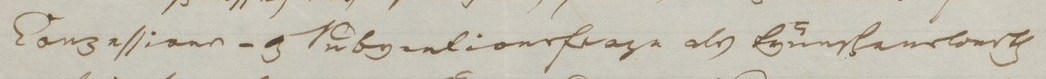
Conzessions- & Subventionsfrage als wünschenswerth
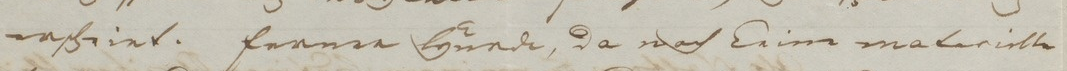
erscheint. Ferner würde, da noch keine materielle
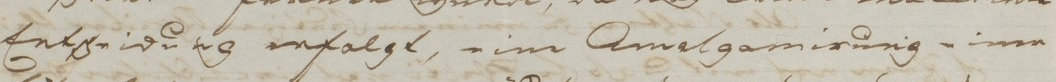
Entscheidung erfolgt, eine Amalgamirung einer
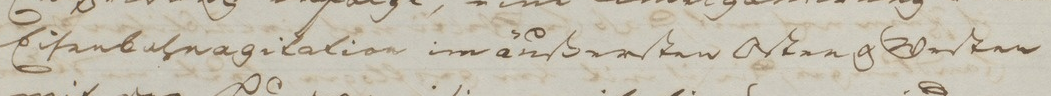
Eisenbahnagitation im äußersten Osten & Westen
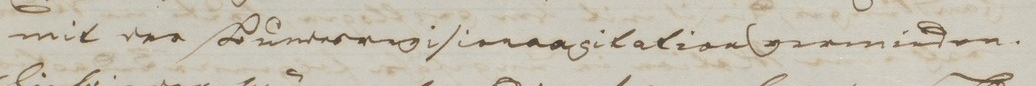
mit der Bundesrevisionsagitation vermieden.
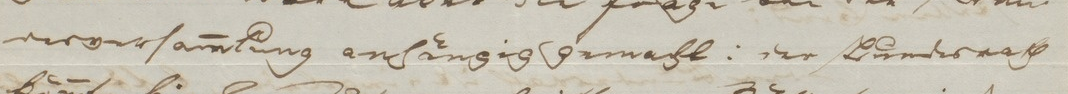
desversammlung abhängig gemacht: der Bundesrath
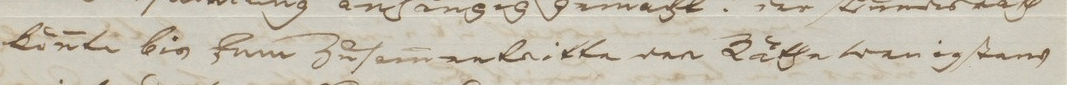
könnte bis zum Zusammentritte der Räthe wenigstens
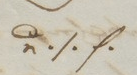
u. s. f.
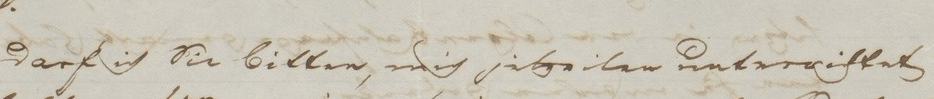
Darf ich Sie bitten, mich jeweilen unterrichtet
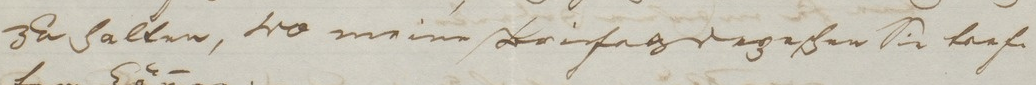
zu halten, wo meine Briefe & Depeschen Sie tref-
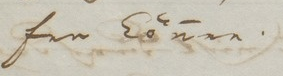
fen können.
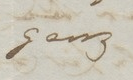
ganz
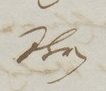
Escher
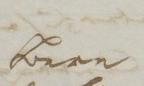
Bern
